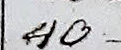40
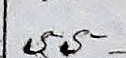55
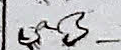53
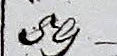59
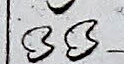33
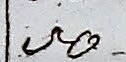50
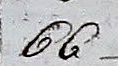66
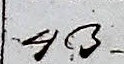43
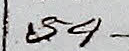54
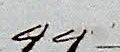44
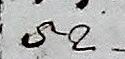52
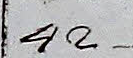42
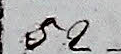52
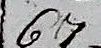67
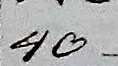40
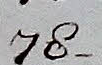78
